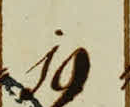19
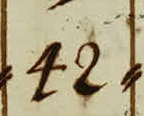42
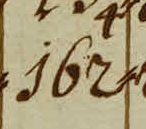162
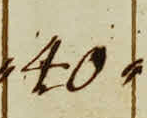40
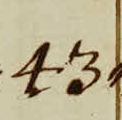43
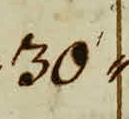30
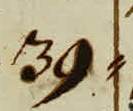39
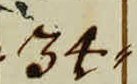34
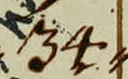34
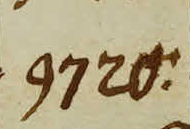9720
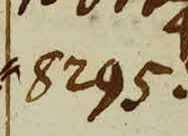8295
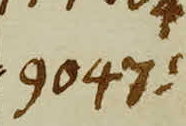9047
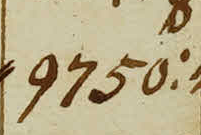9750
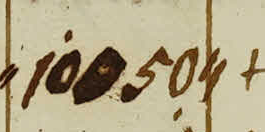100504
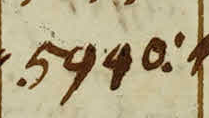5940:
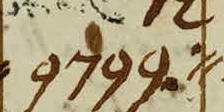9799.
